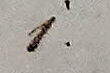1.
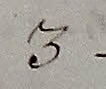3
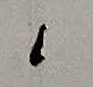1
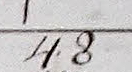48
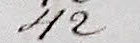42
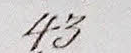43
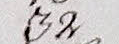32
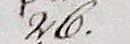26.
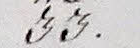33.
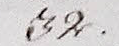32
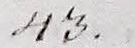43.
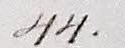44.
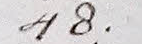48.
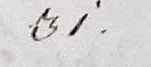31.
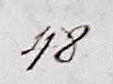48
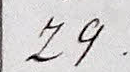29
